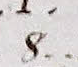8.
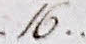16
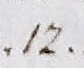12
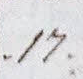17
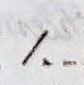1.
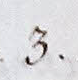3
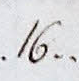16
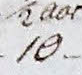10
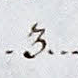3.
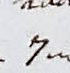7
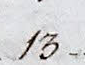13
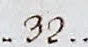32
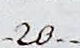20
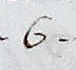6
